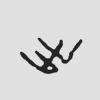出
